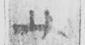廿
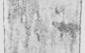二
